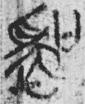○（萃）
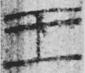王
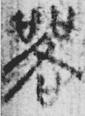○（假）
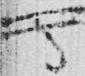于
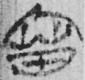○（廟）
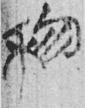利
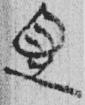見
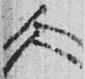大
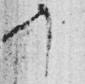人
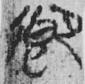卿（亨）
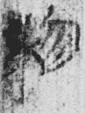利
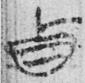貞
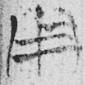用
